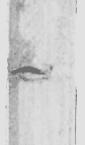二
